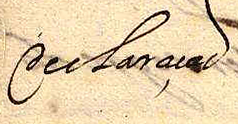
declaraçaõ
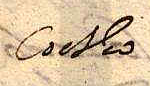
Coelho
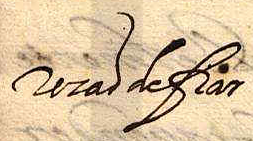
rezaõ de fiar
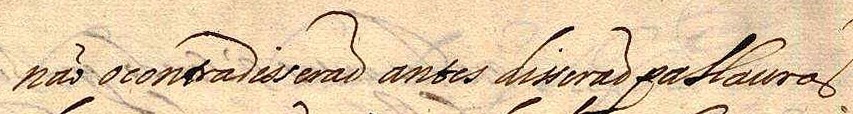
não o contradisseraõ antes disseraõ pallauras
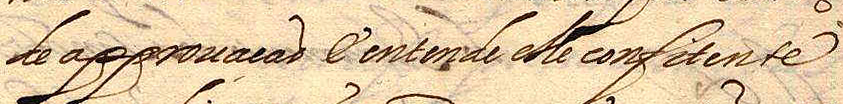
de approuação e entende elle confitente
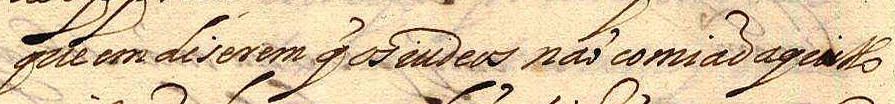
que em diserem q̄ os iudeos naõ comiaõ aquillo
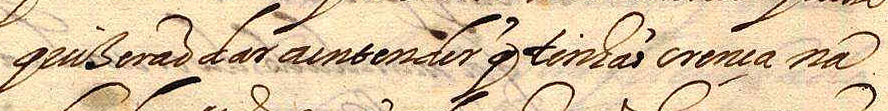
quizerão dar a entender q̄ tinhaõ crença na
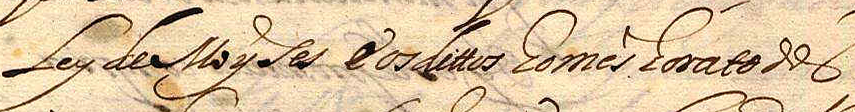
Ley de Moyses e os dittos homēs hora todos
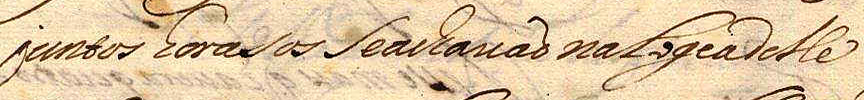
juntos hora sos se achauão na Logea delle
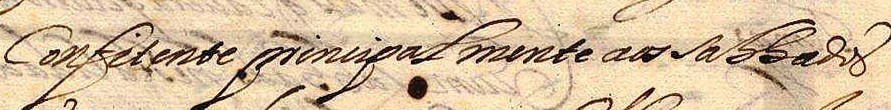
Confitente principalmente aos sabbados
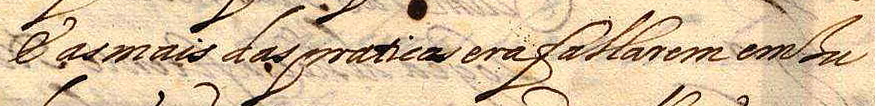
E as mais das praticas era fallarem em Iu
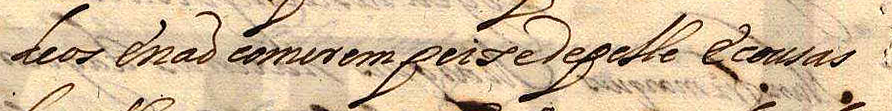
deos e naõ comerem peixe de pelle e cousas
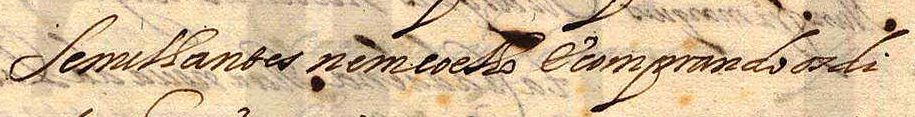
Semelhantes nem coelho e comprando os di
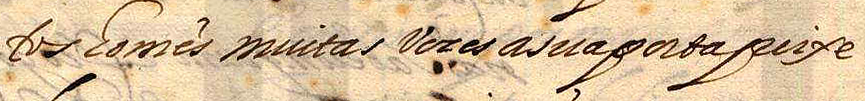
tos homēs muitas vezes a sua porta peixe
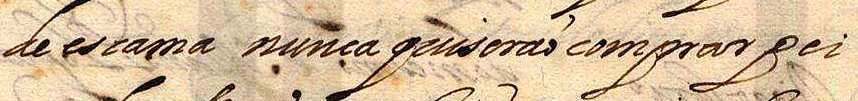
de escama nunca quiseraõ comprar pei
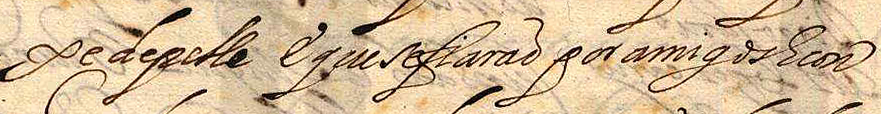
xe de pelle e que se fiaraõ por amigos E con
